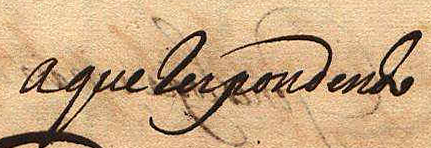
a que Respondendo
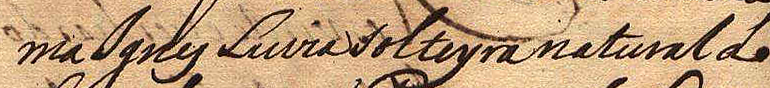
ma Ignes Luiza solteyra natural do
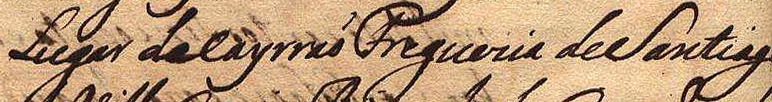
Lugar de cayrraõ Freguezia de Santiago
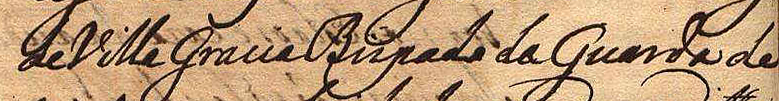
de Villa Gracia Bispado da Guarda de
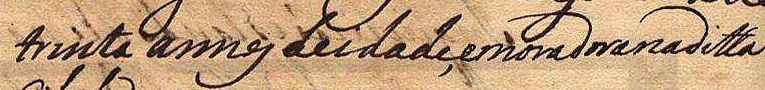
trinta annos de idade, e moradora na ditta
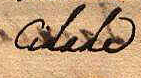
Cidade
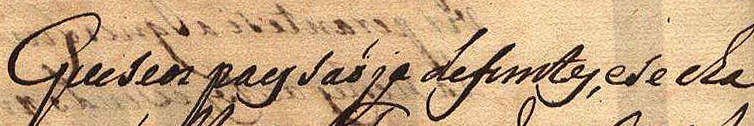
Que seos pays saõ ja defuntos, e se cha
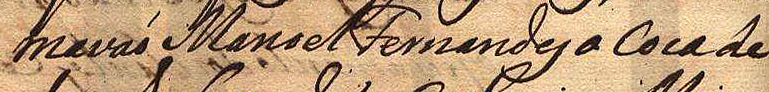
mavaõ Manoel Fernandes o Coca de
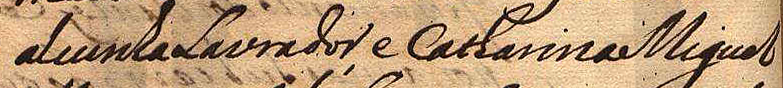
alcunha Lavrador, e Catharina Miguel
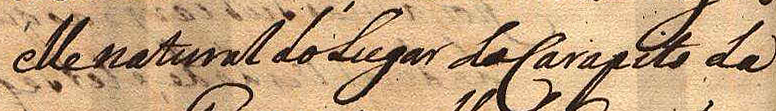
elle natural do Lugar do Carapito da
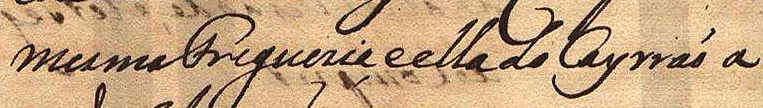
mesma Freguezia, e ella do Cayrraõ a
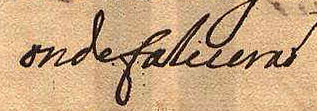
onde faleceraõ
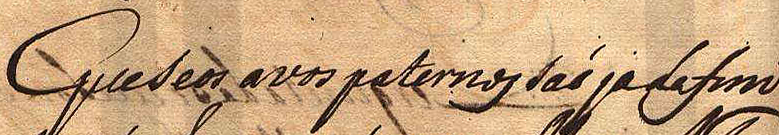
Que seos avos paternos saõ ja dafun
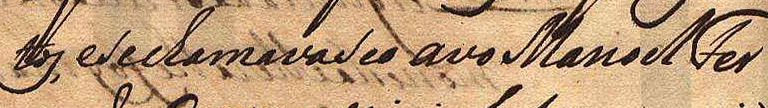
tos, e se chamava seo avo Manoel Fer
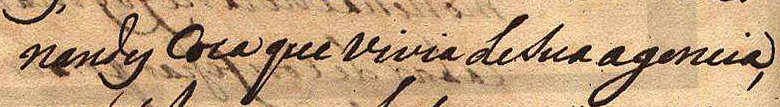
nandes Coca que vivia de sua agencia,
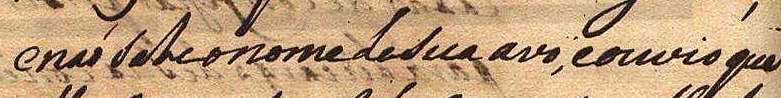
e naõ sabe o nome de sua avo, e ouvio que
